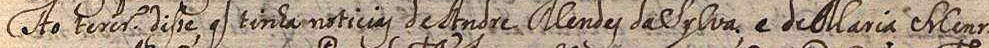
Ao tercr.o disse, q̄ tinha noticias de Andre Mendes da Sylva, e de Maria Henr
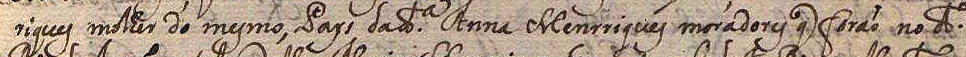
riques molher do mesmo, Pays da d̄.a Anna Henrriques moradores q̄ foraõ no d̄.o
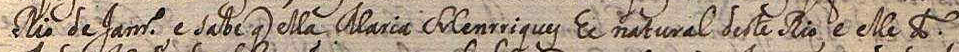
Rio de Janr.o, e sabe q̄ ella Maria Henrriques he natural deste Rio, e elle d̄.o
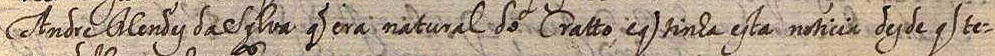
Andre Mendes da Sylva q̄ era natural do Cratto, e q̄ tinha esta noticia desde q̄ te
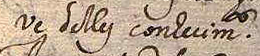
ve delles conhecimto.
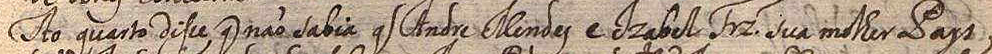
Ao quarto disse, q̄ naõ sabia q̄ Andre Mendes e Izabel Frz̄ sua molher Pays,
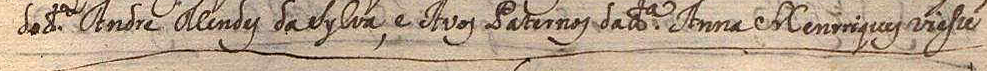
do d̄.o Andre Mendes da Sylva, e Avos Paternos da d̄a. Anna Henrriques viessē
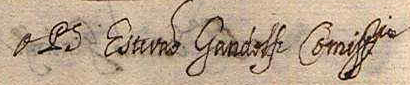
o PS Estevaõ Gandolfi Comissrio
